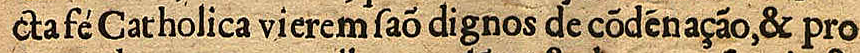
cta fé Catholica vierem saõ dignos de cōdēnação, & pro
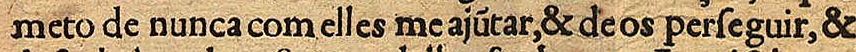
meto de nunca com elles me ajūtar, & de os perseguir, &
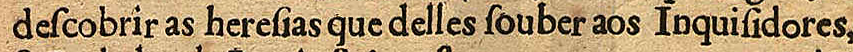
descobrir as heresias que delles souber aos Inquisidores,
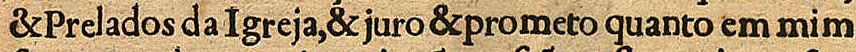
& Prelados da Igreja, & juro & prometo quanto em mim
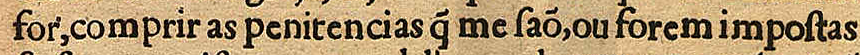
for, comprir as penitencias q̄ me saõ, ou forem impostas
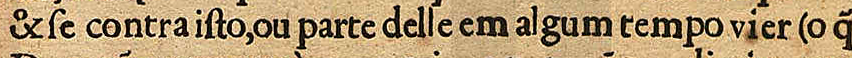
& se contra isto, ou parte delle em algum tempo vier (o q̄
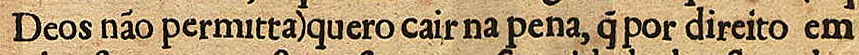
Deos não permitta) quero cair na pena, q̄ por direito em
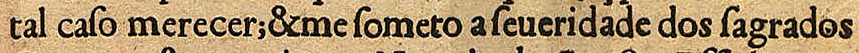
tal caso merecer; & me someto a seueridade dos sagrados
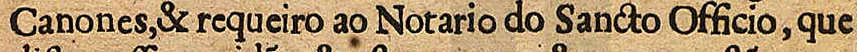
Canones, & requeiro ao Notario do Sancto Officio, que
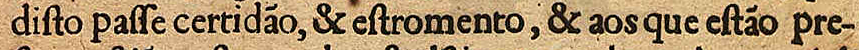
disto passe certidão, & estromento, & aos que estão pre
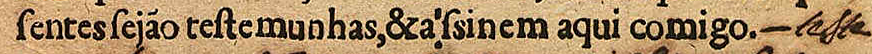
sentes sejão testemunhas, & assinem aqui comigo. - teste
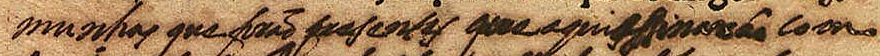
munhas que foraõ presentes que aqui assinaraõ com
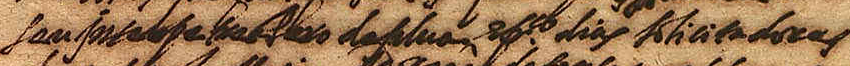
seu jnterpetre Pero da silua, E fr.co dias solicitadores
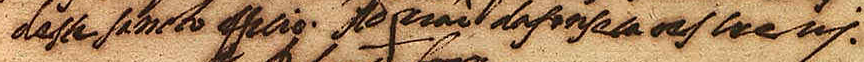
deste sancto officio. Adriaõ da fonseca o escreuj.
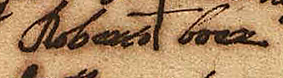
Roberto + boer
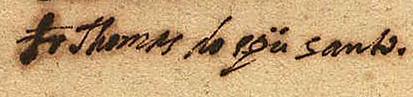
fr Thomas do spū santo.
